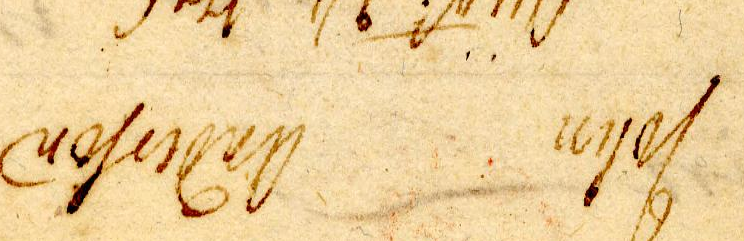John Anderson
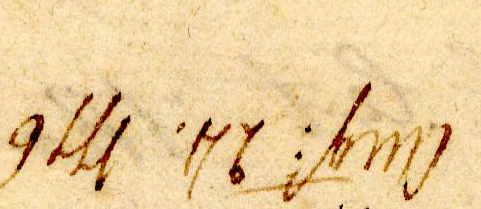Aug^t: 24. 1776
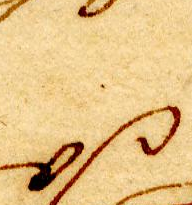To
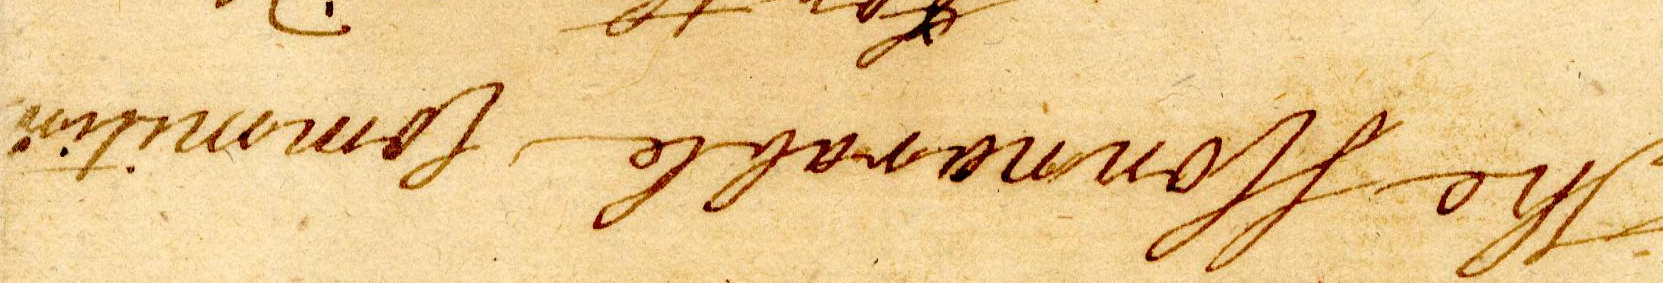The Honnarable Commitie
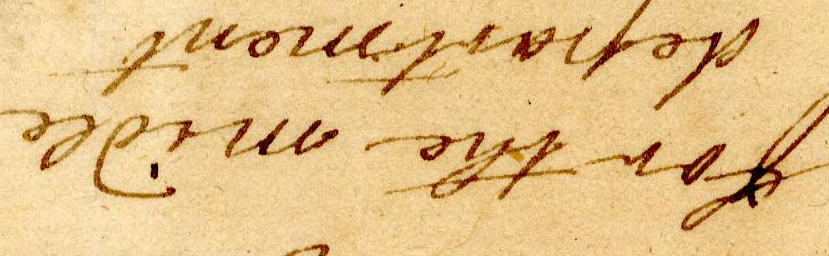for the midle
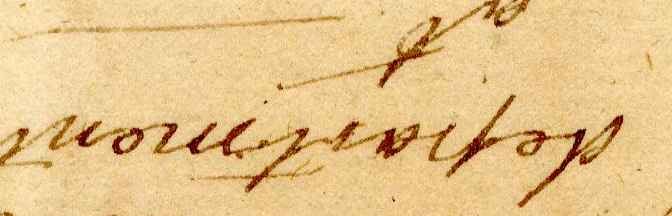department
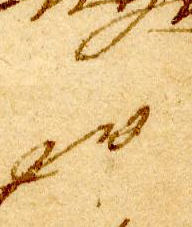at
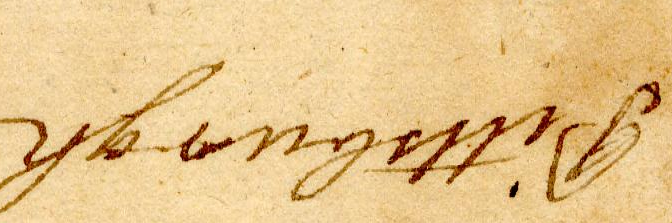Pittsburgh
